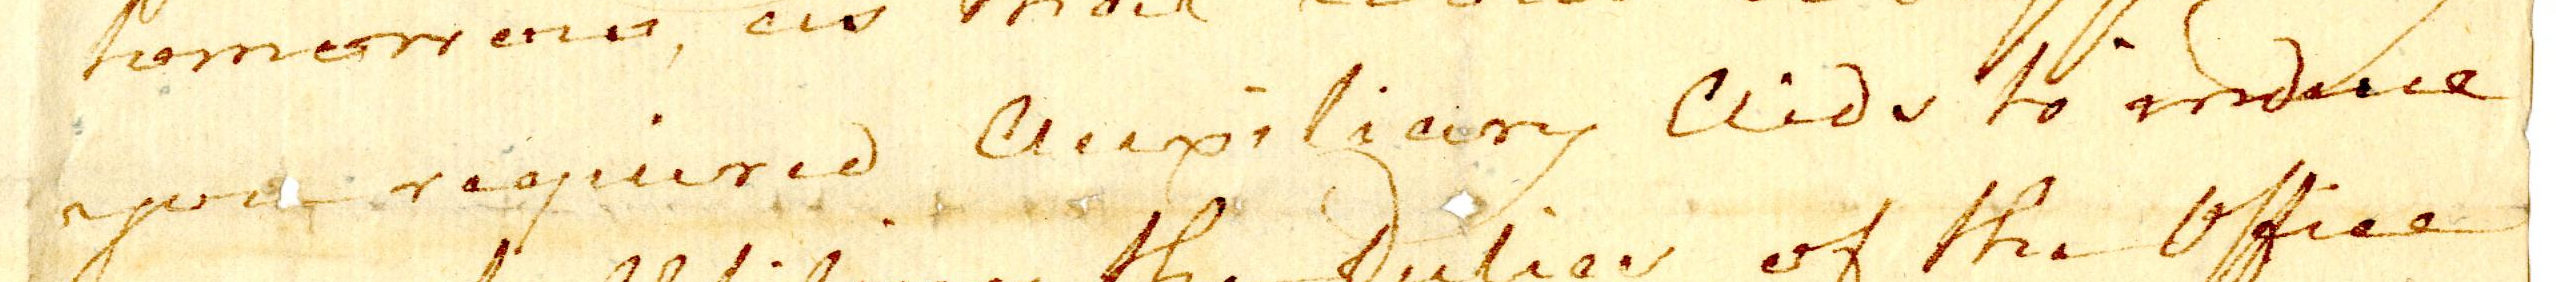you required Auxiliary aide to induce
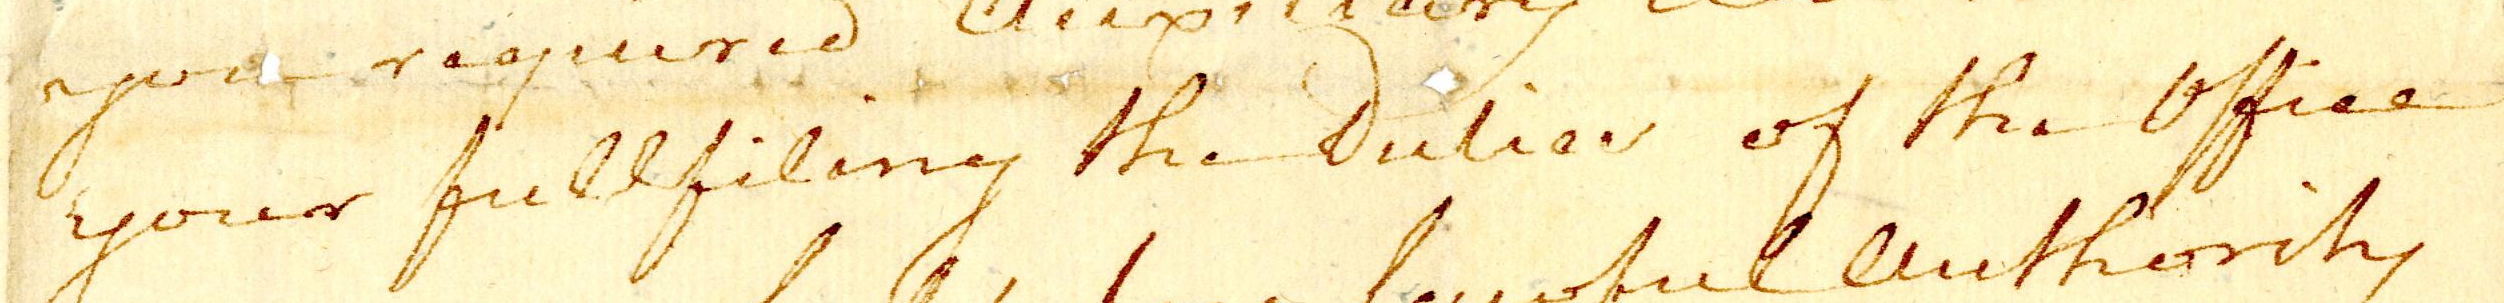your fullfiling the duties of the Office
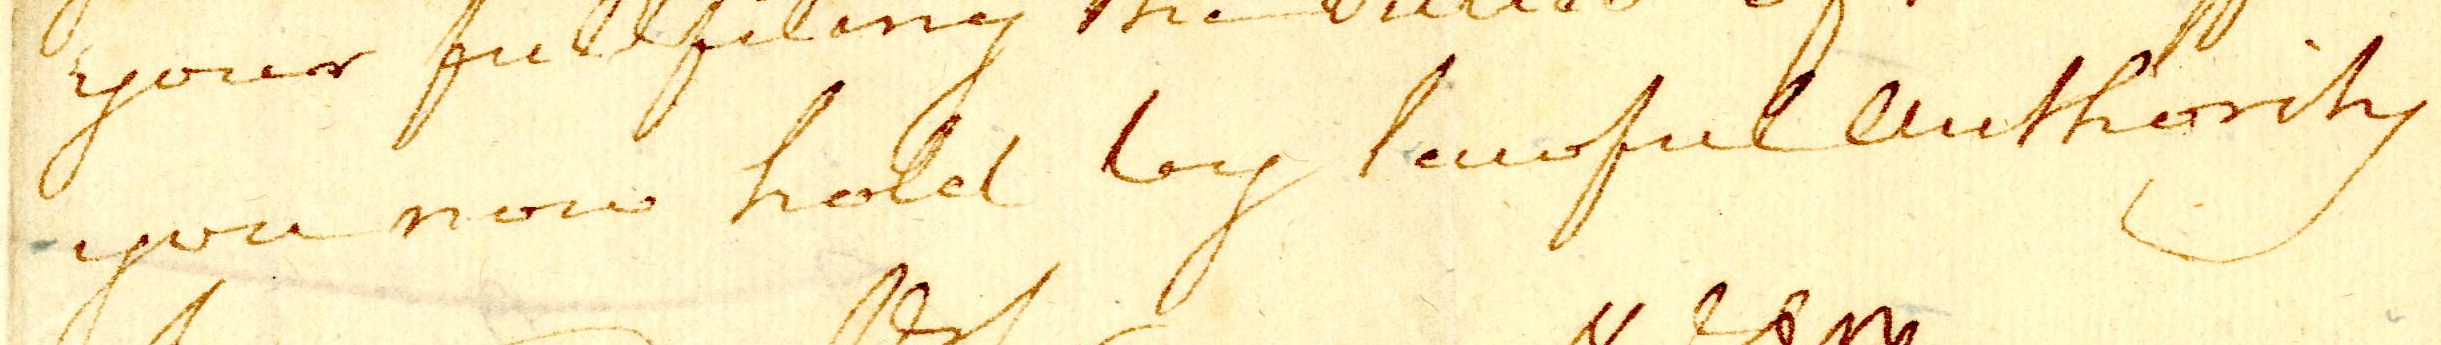you now hold by lawful authority
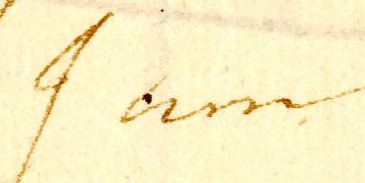I am
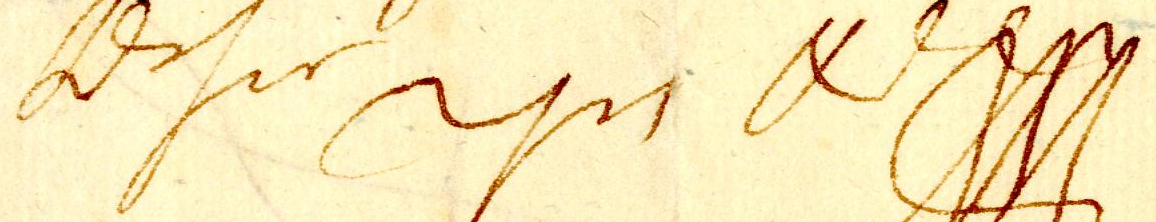D^r sir Yrs WM
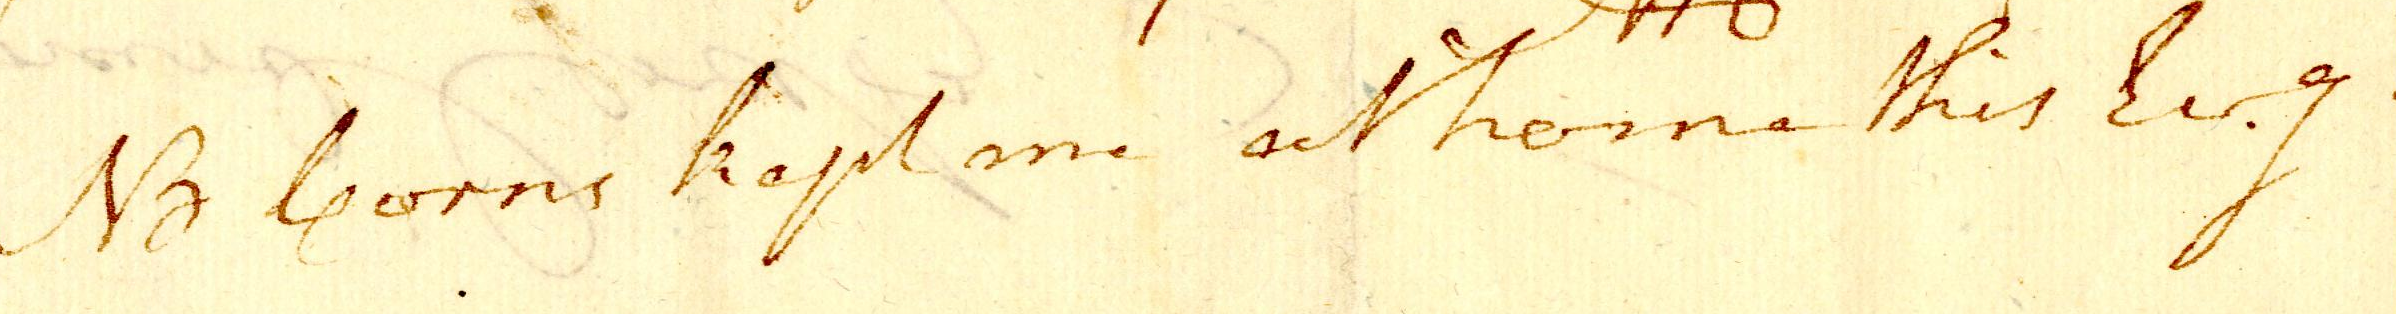NB orns kept me at home this Ev^g
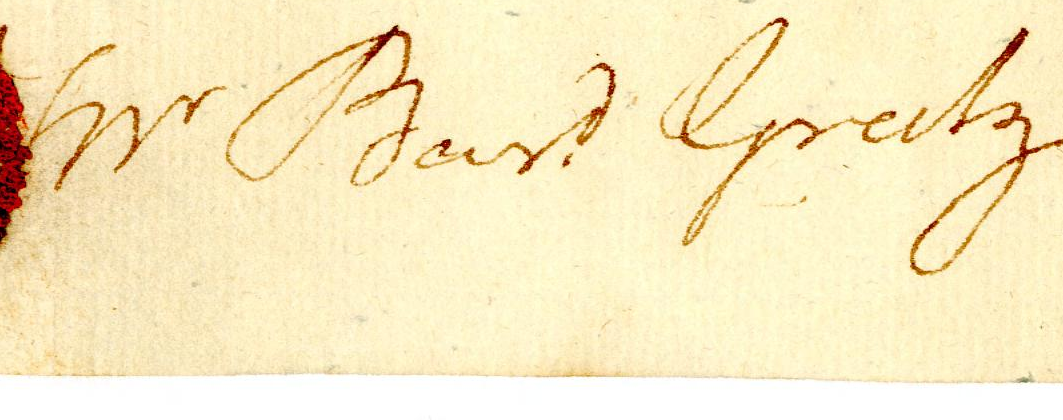M^r Bar^d Gratz
